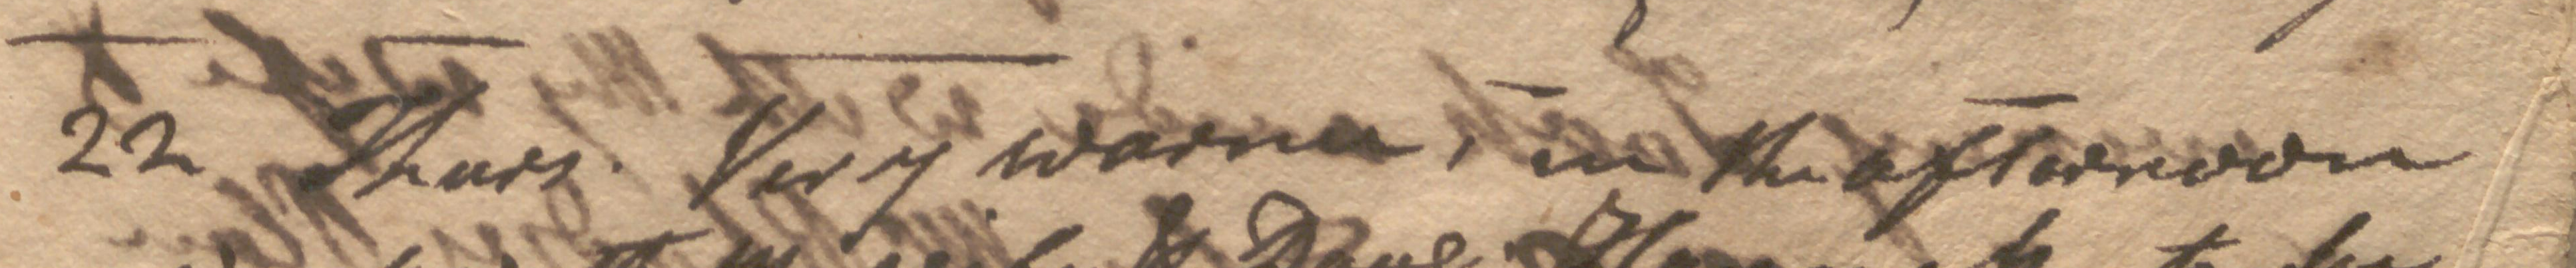22 Thurs. Very warne, in the afternoon
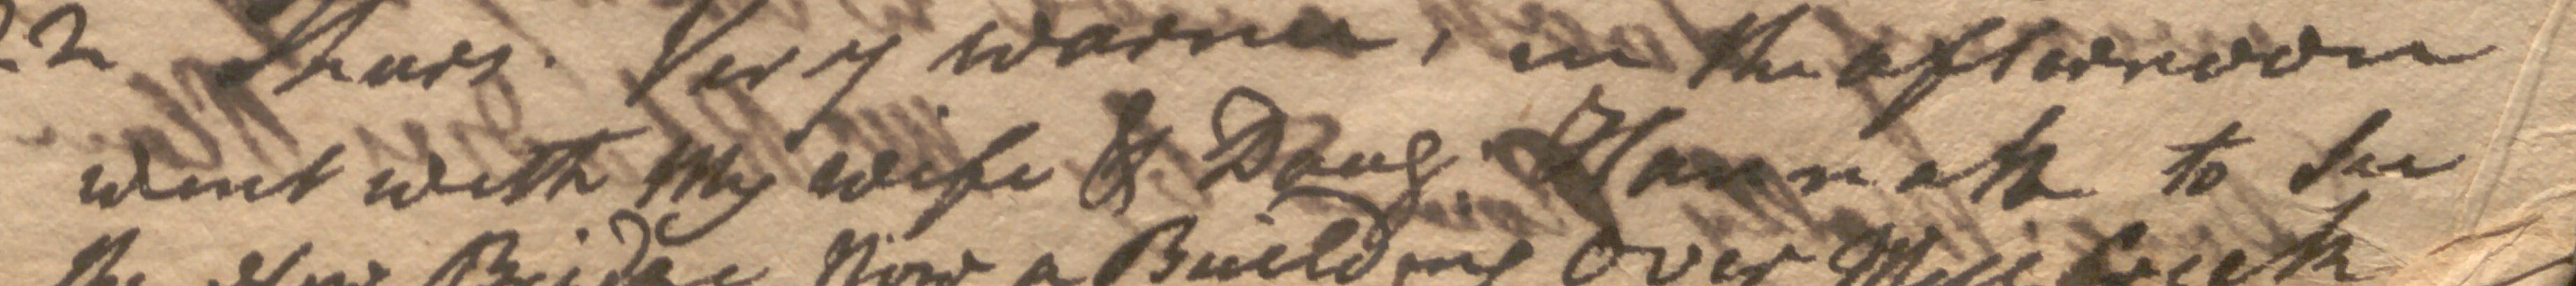went with My wife & Daug Hannah to See
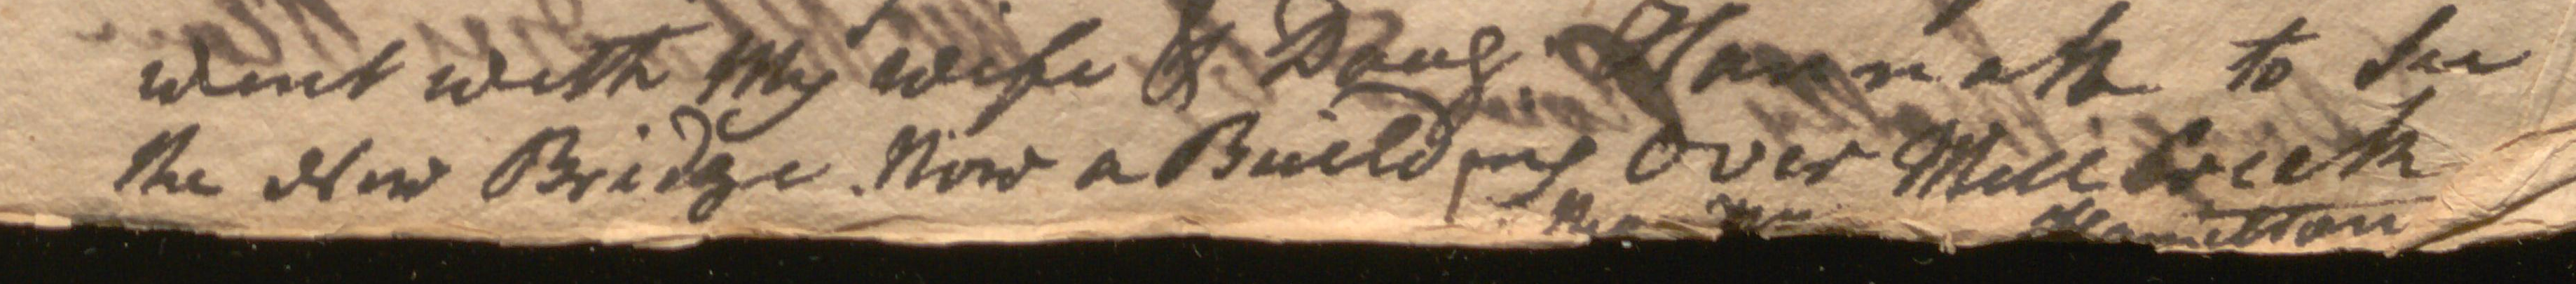The New Bridge now a Building, over Mill Creel
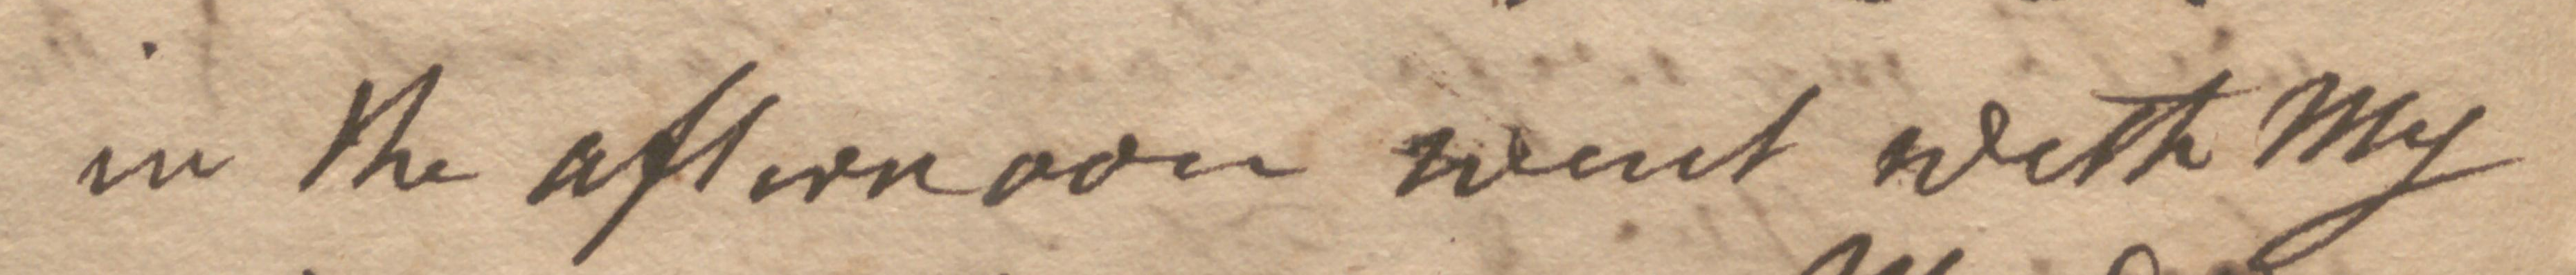in the afternoon went with My
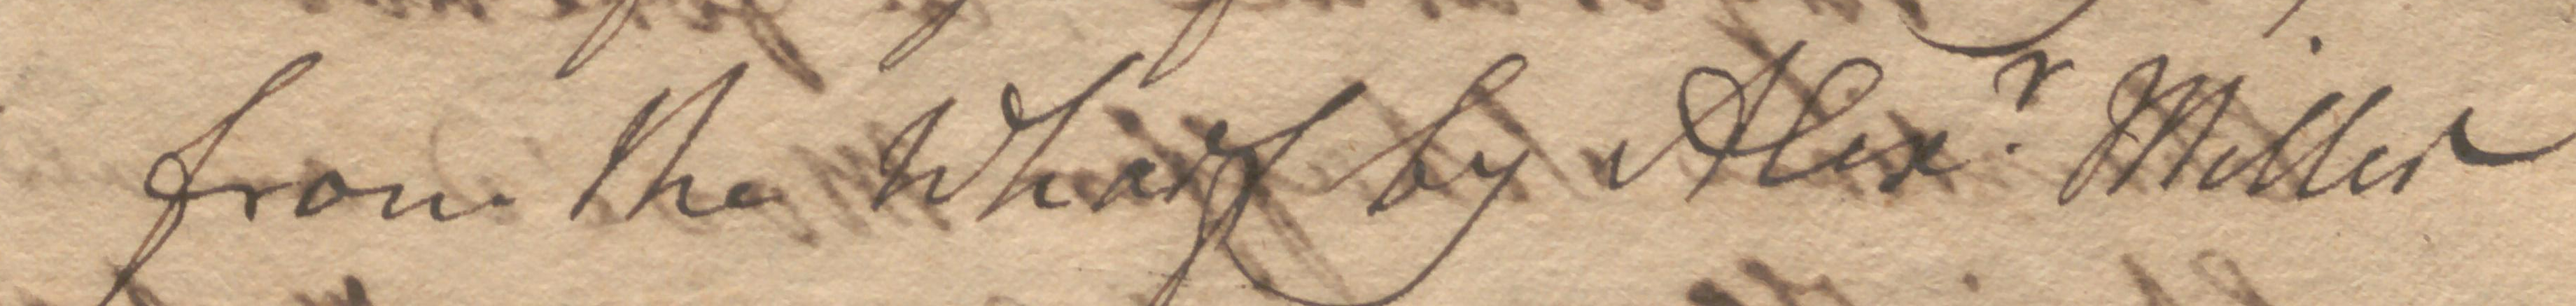from the Wharf by Alex^r. Miller
